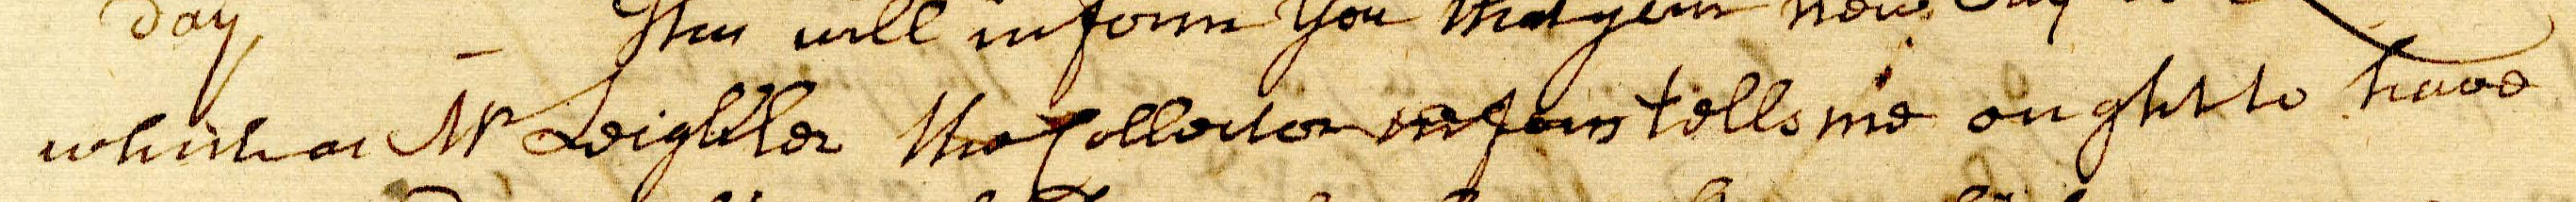which as M^r Leighster the Collector [informs] tells me ought to have
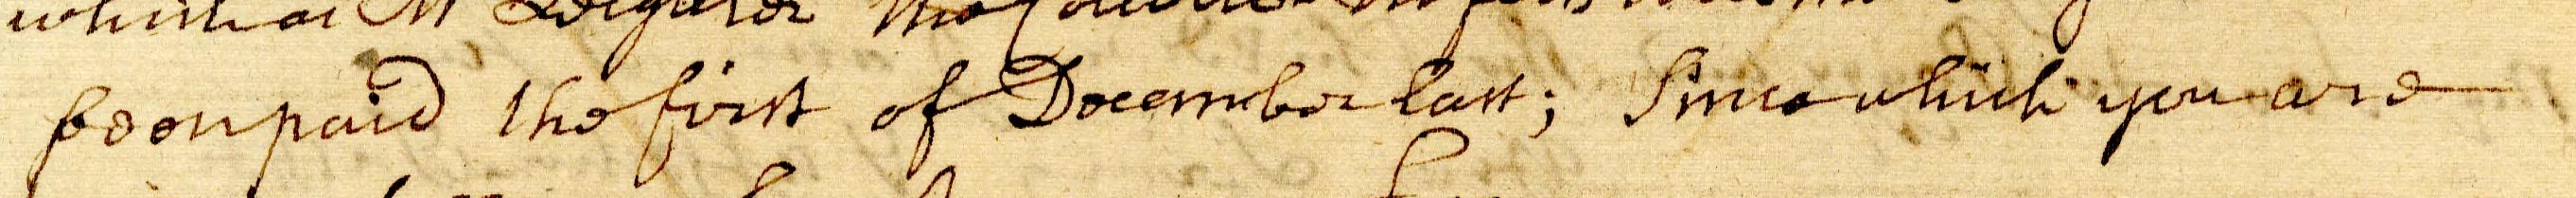soon paid the first of December last; Since which you are
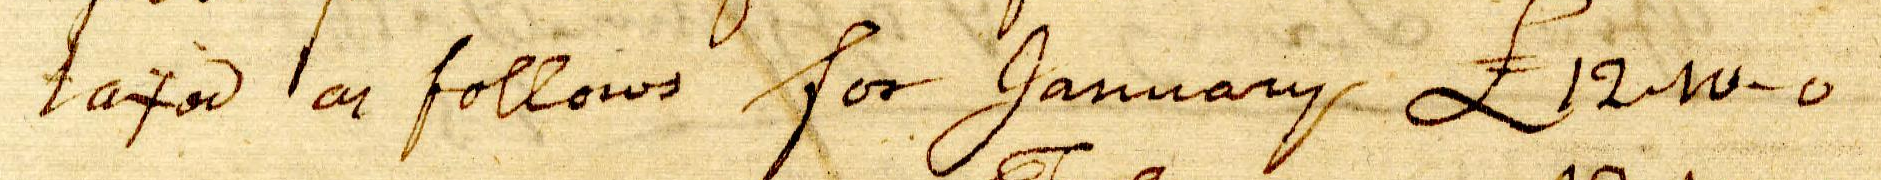taxed as follows for January £12-10-0
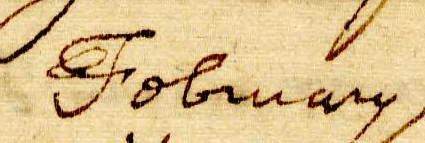Febrarury
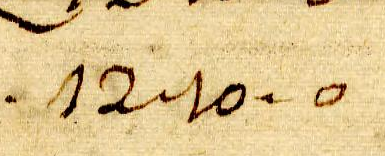12-10-0
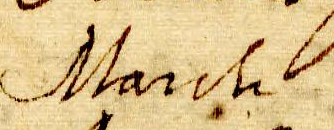March
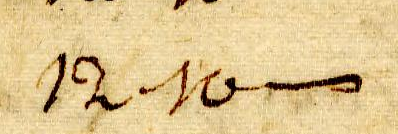12-10-
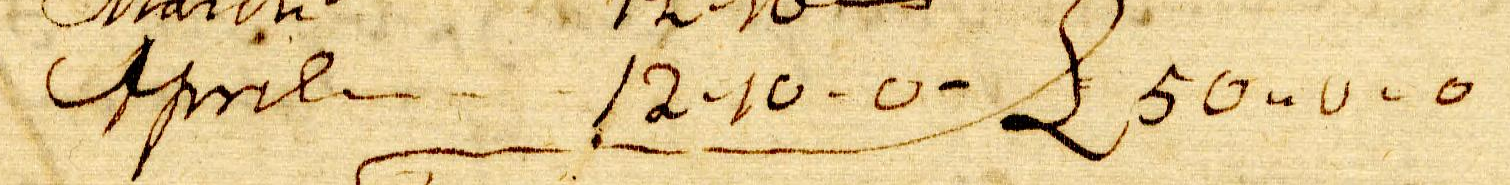April--- 12-100-£50.0.0
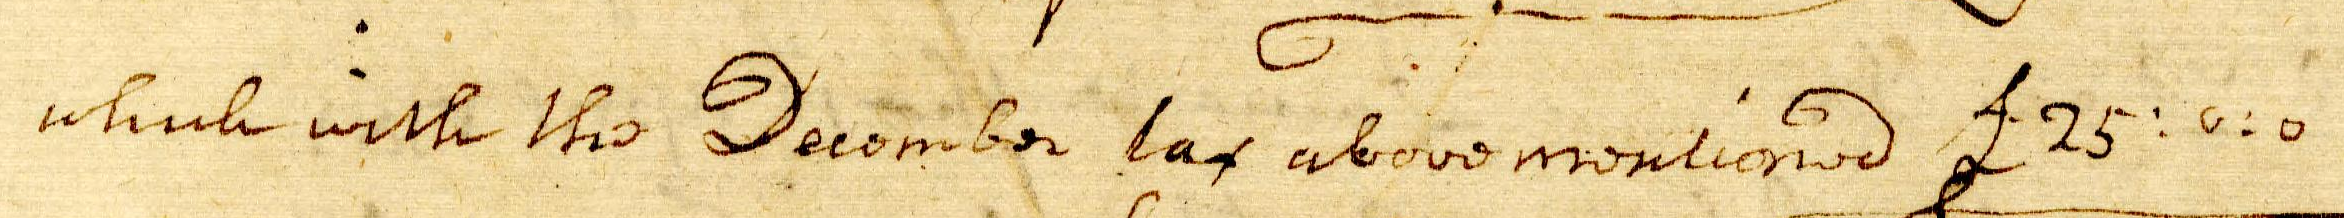which with the December tax above mentioned £25:0:0
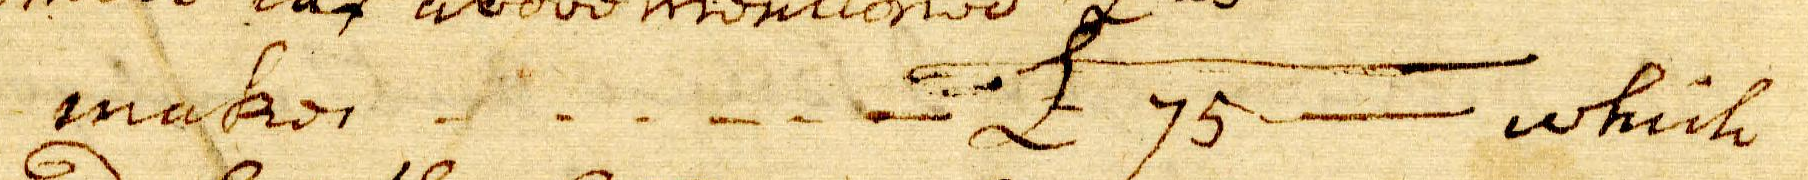makes------ £75- which
